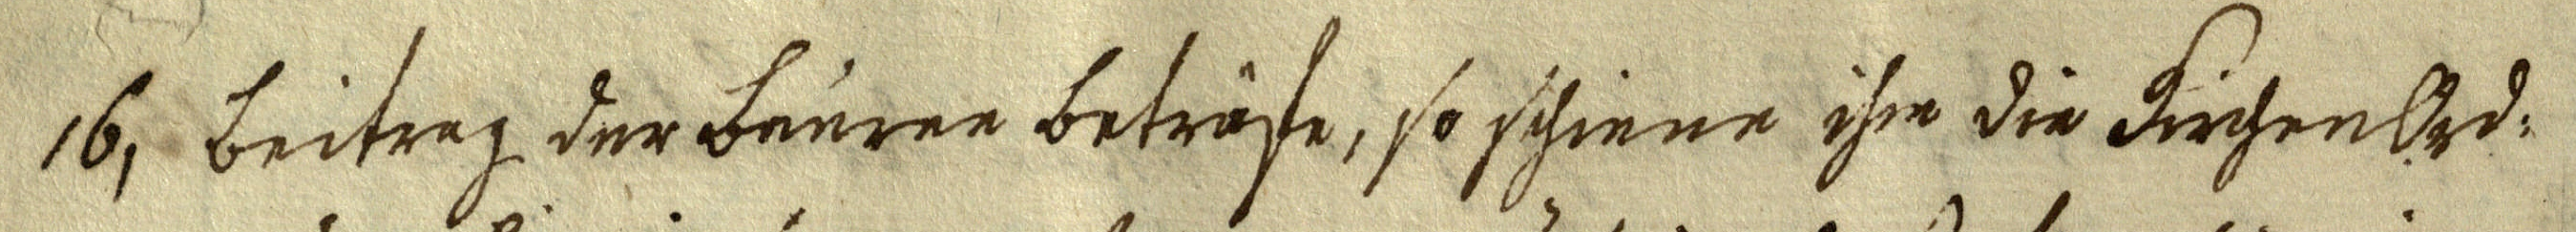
Beitrag der Bauren beträfe, so schiene ihm die KirchenOrd¬
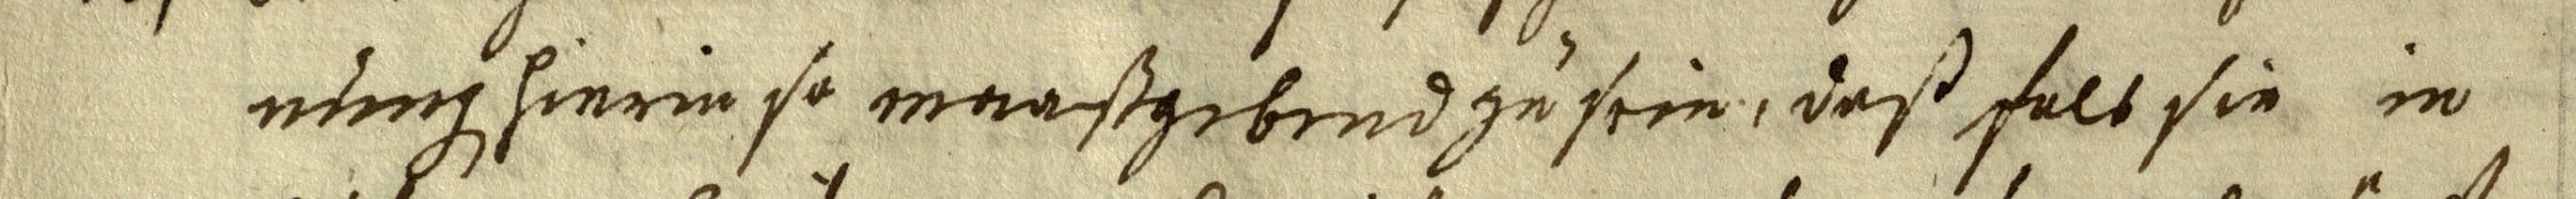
nung hierin so maaßgebend zu sein, daß fals sie in
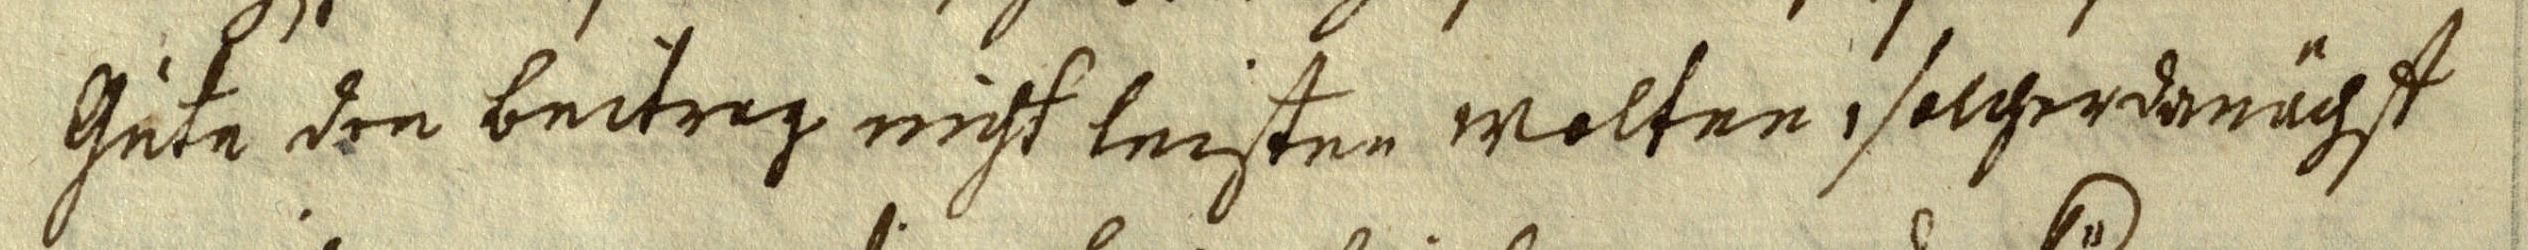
Gute den Beitrag nicht leisten wolten, solcherdanächst
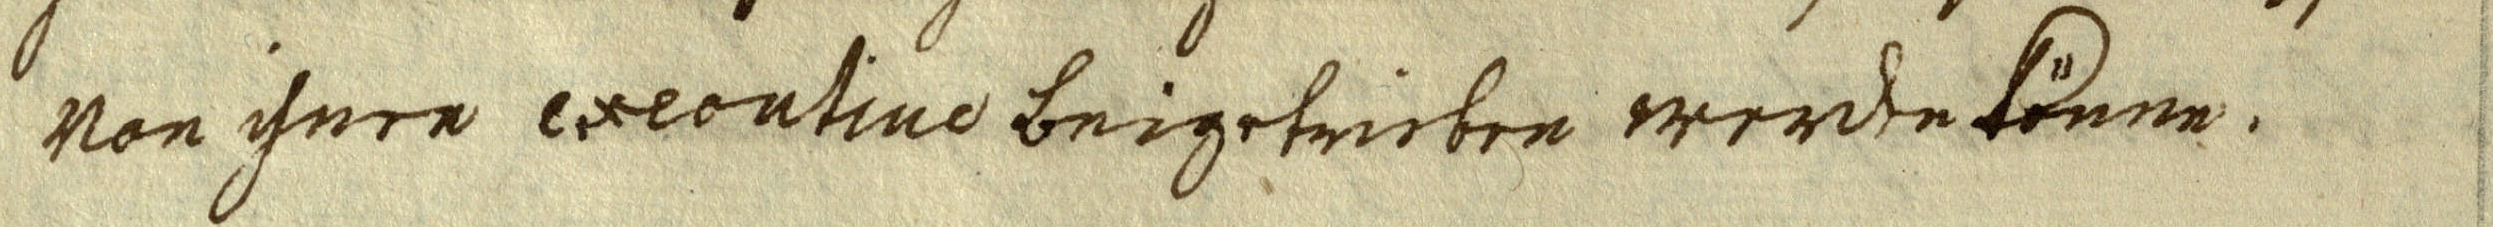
von ihnen excontine beigetrieben werden könne.
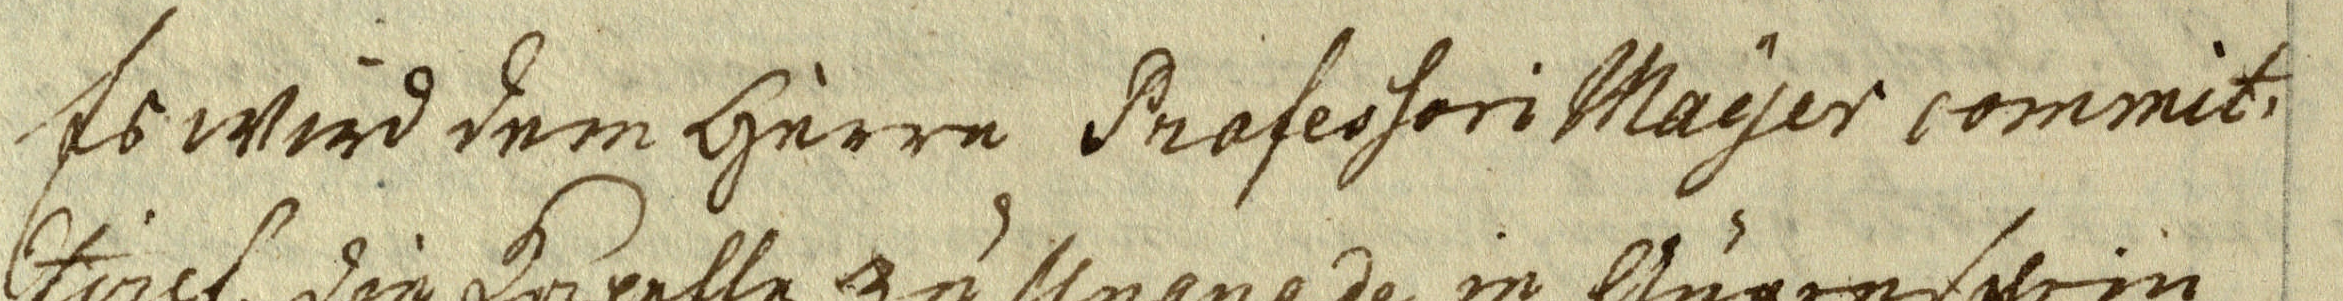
Es wird dem Herrn Professori Maÿer commit¬
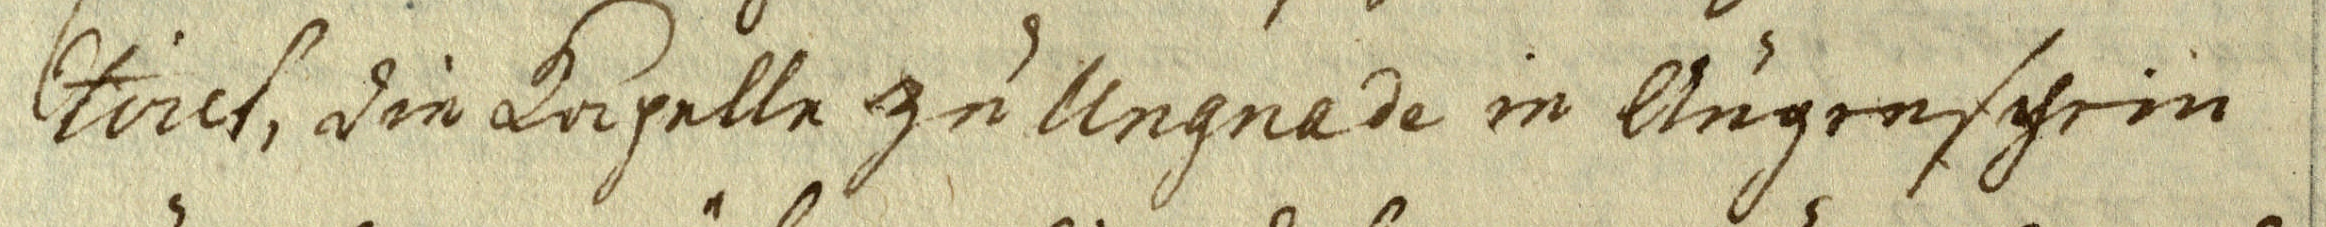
tiret, die Kapelle zu Ungnade in Augenschein
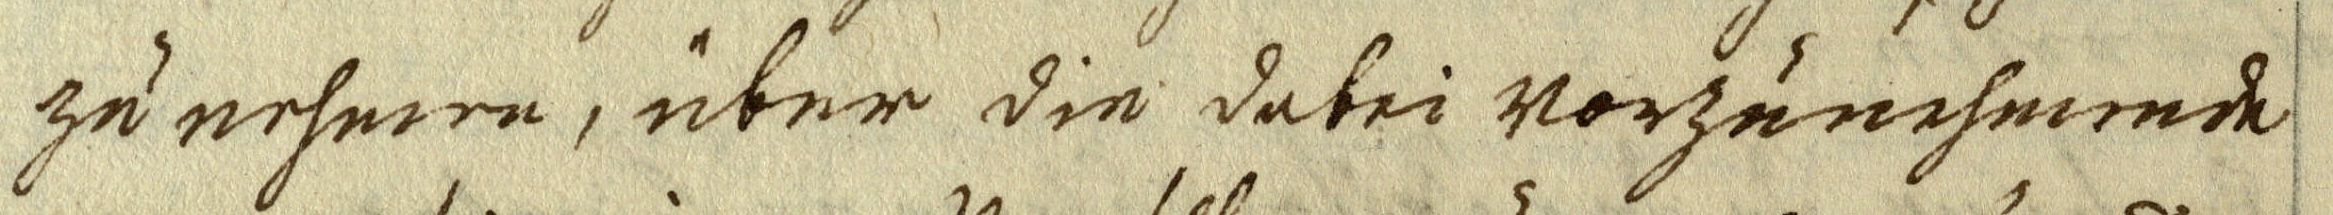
zu nehmen, über die dabei vorzunehmende
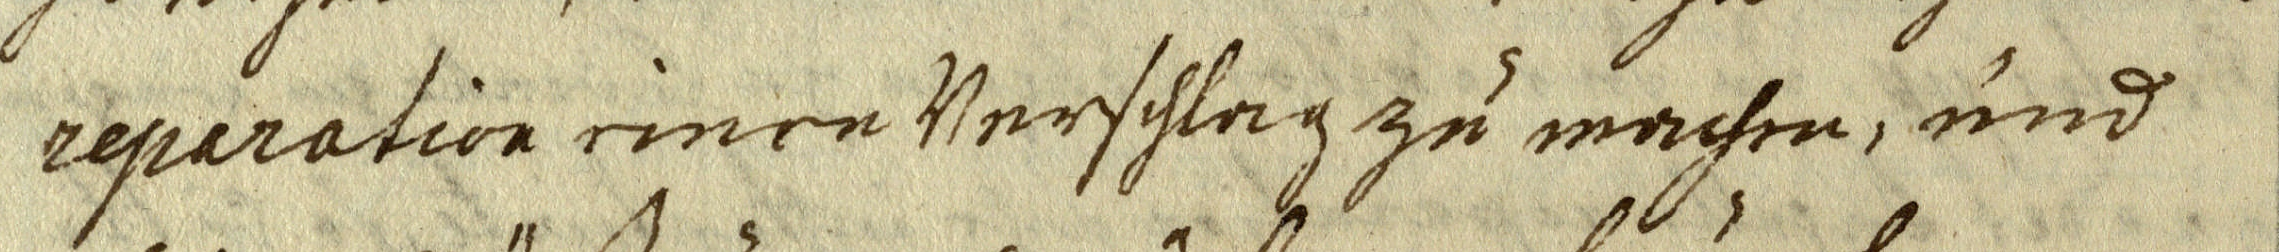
reparation einen Verschlag zu machen, und
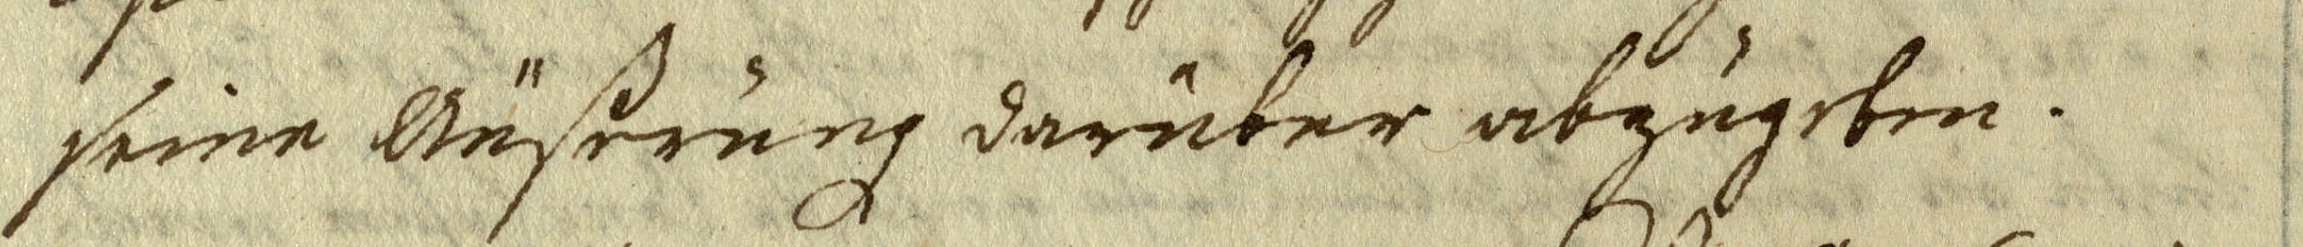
seine Äußerung darüber abzugeben.
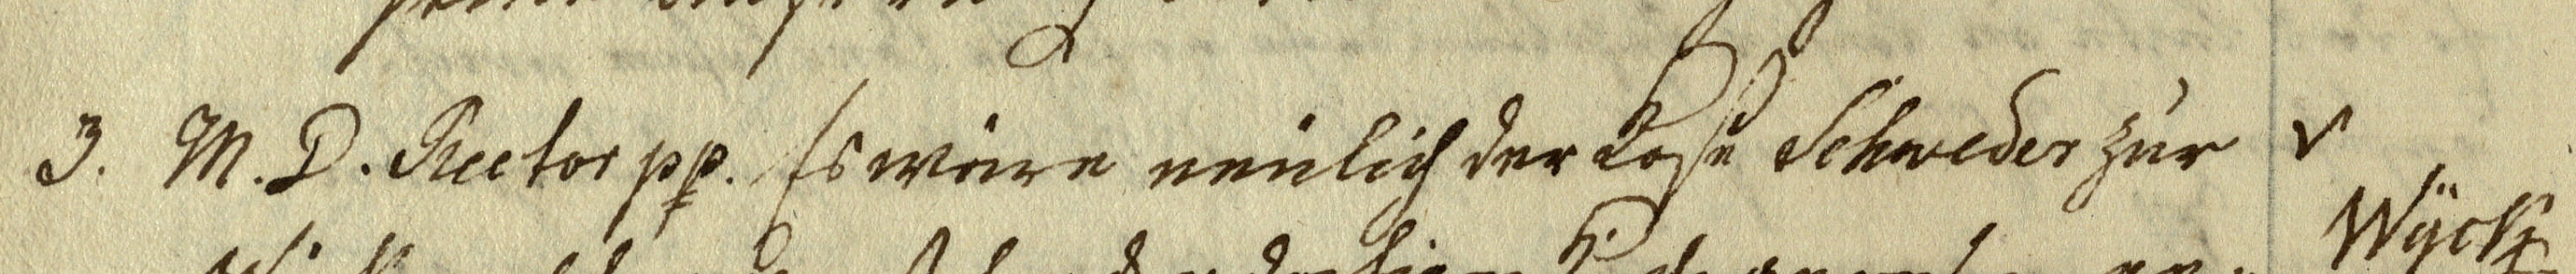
3. M. D. Rector pp. Es wäre neulich der Koße Schweder zur
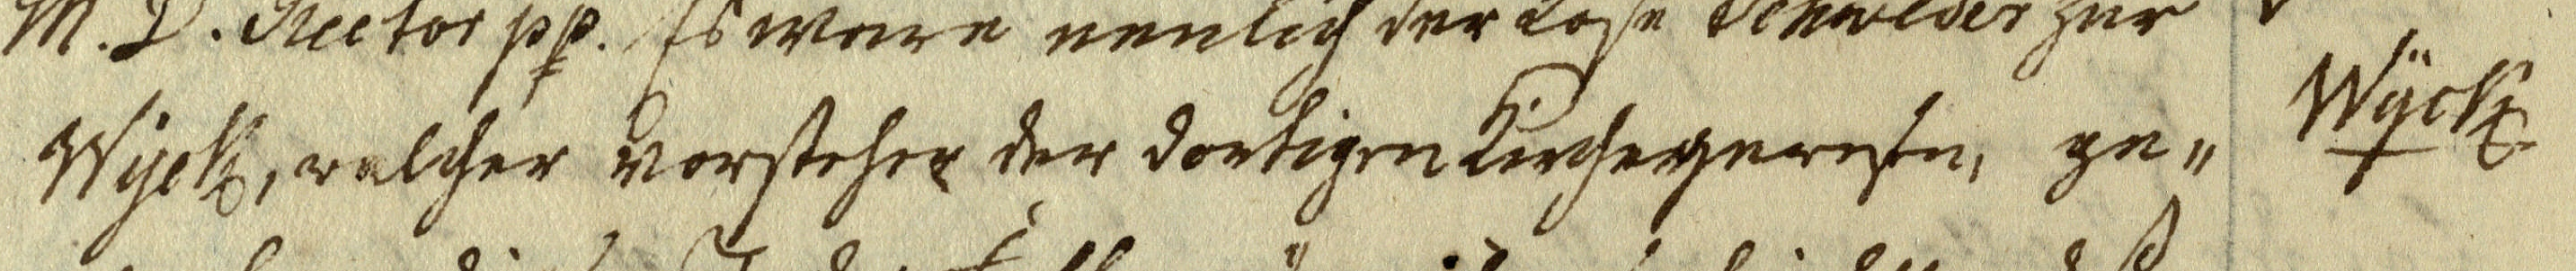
Wÿck, welcher vorsteher der dortigen Kirchegewesen, ge¬ Wÿck
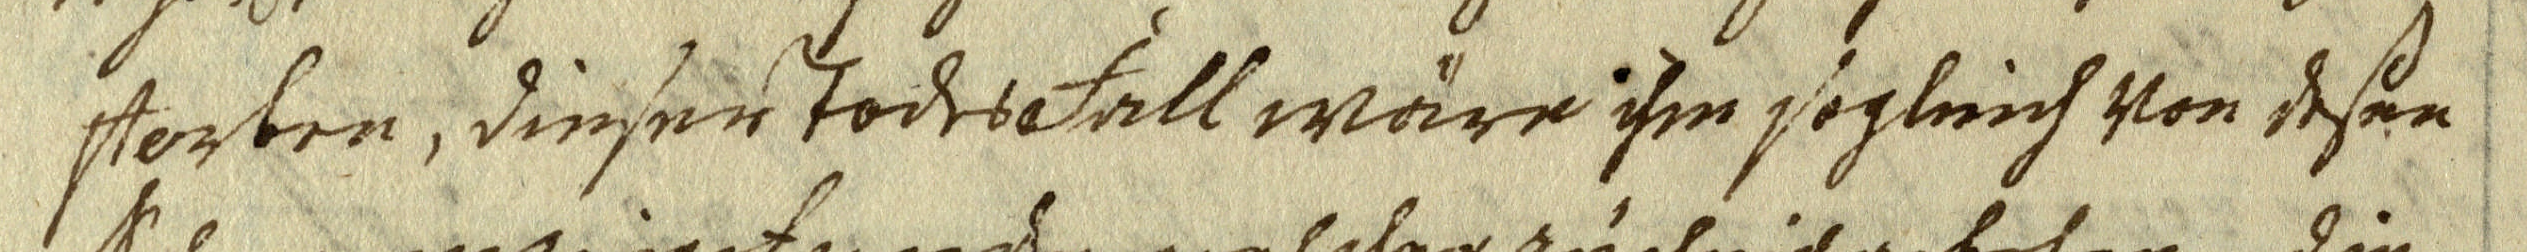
storben, dieser TodesFall wäre ihm sogleich von deßen
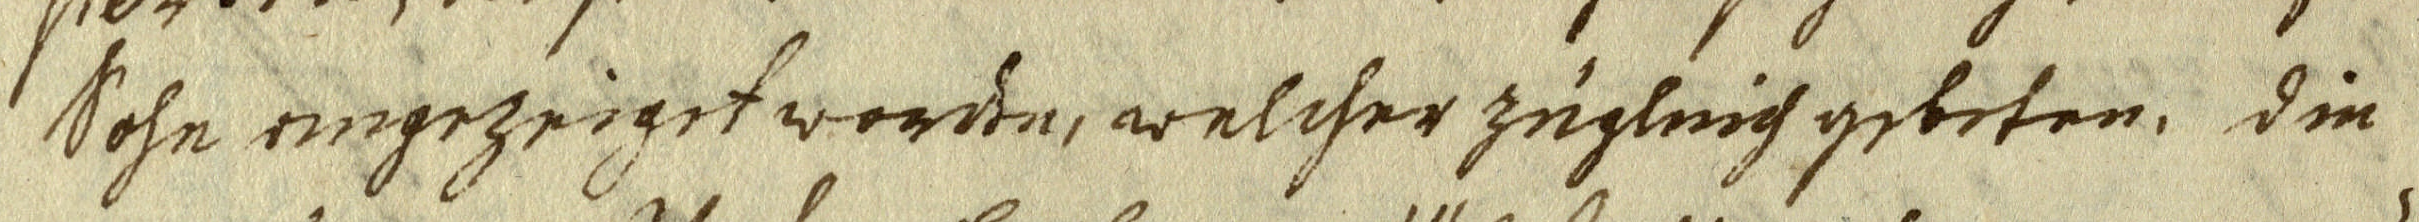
Sohn angezeiget worden, welcher zugleich gebeten, die
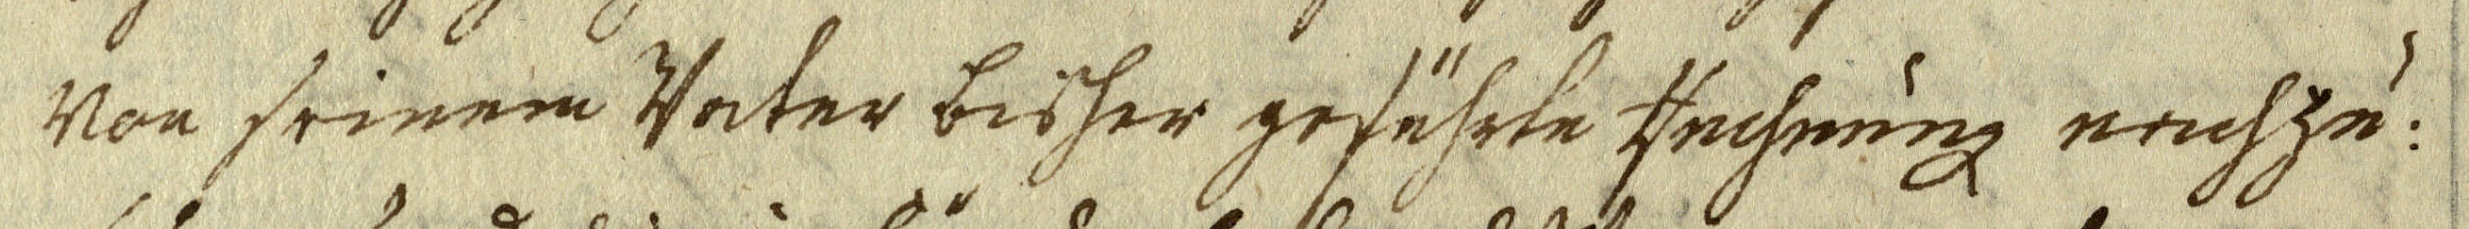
von seinem Vater bisher geführte Rechnung nachzu¬
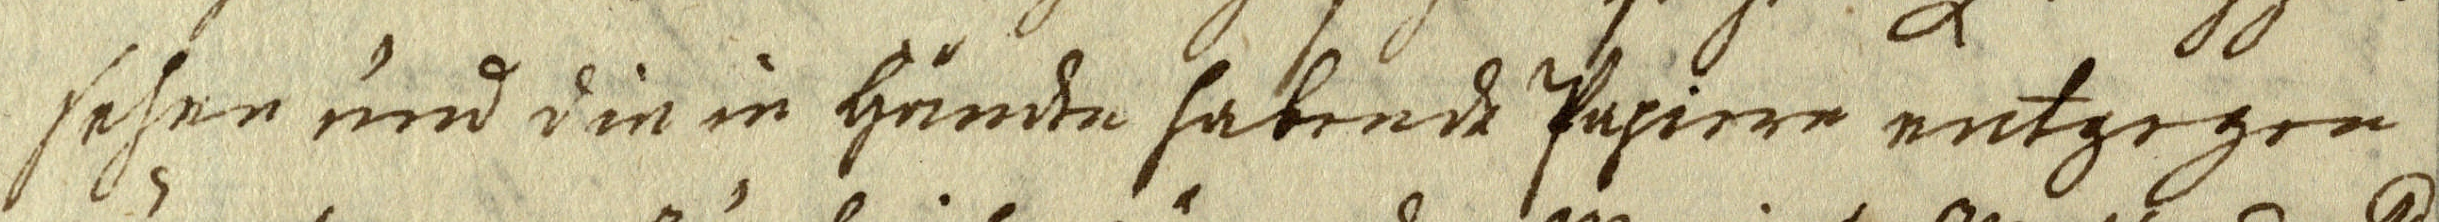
sehen und die in Händen habende Papiere entgegen
